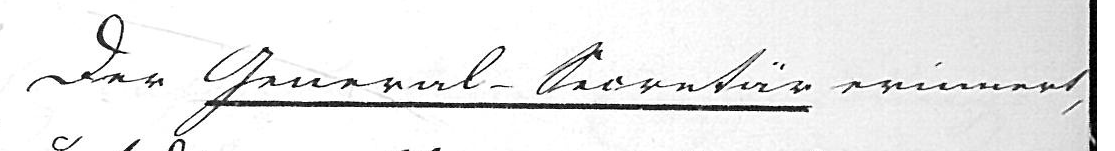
Der General-Secretär erinnert,
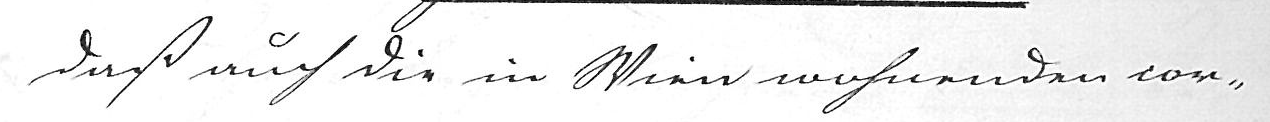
daß auch die in Wien wohnhaften cor-
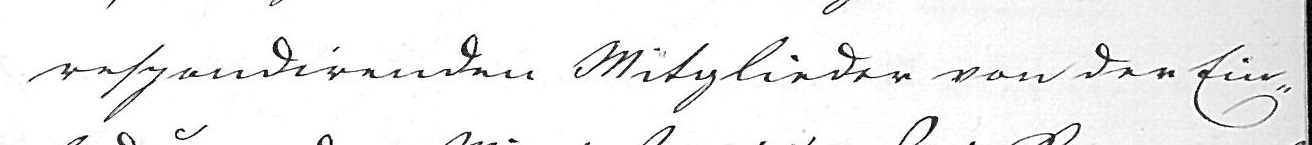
respondirenden Mitglieder von der Ein-
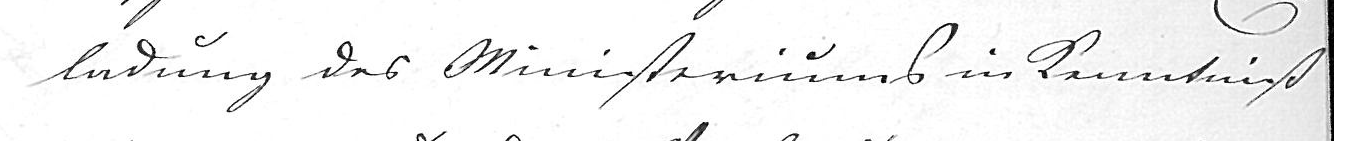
ladung des Ministeriums in Kenntniß
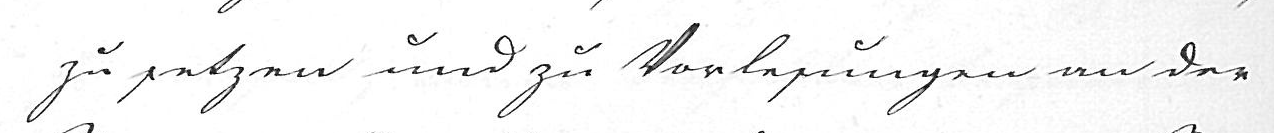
zu setzen und zu Vorlesungen an der
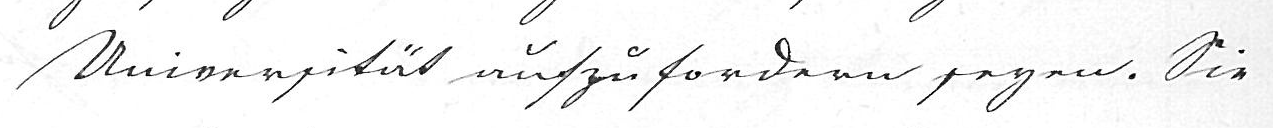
Universität aufzufordern seyen. Sie
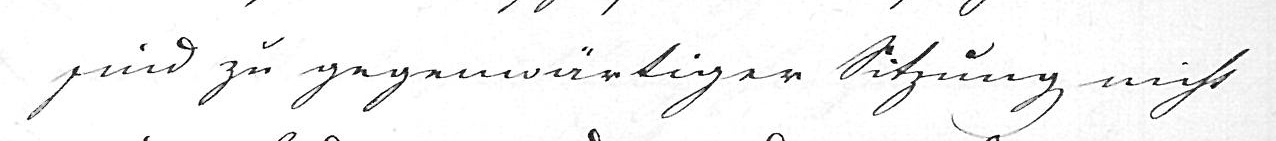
und zu gegenwärtigen Sitzung nicht
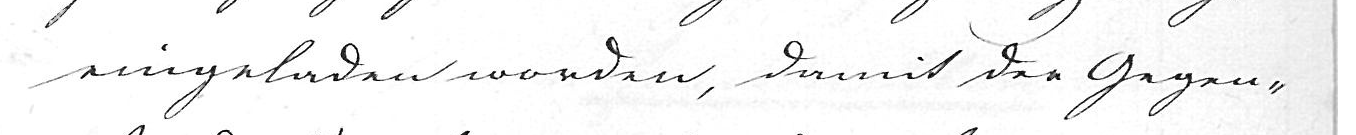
eingeladen worden, damit der Gegen-
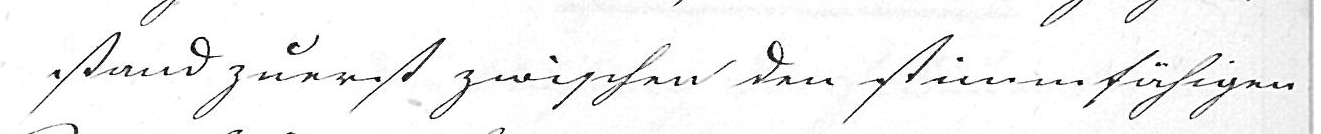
stand zuerst zwischen den stimmfähigen
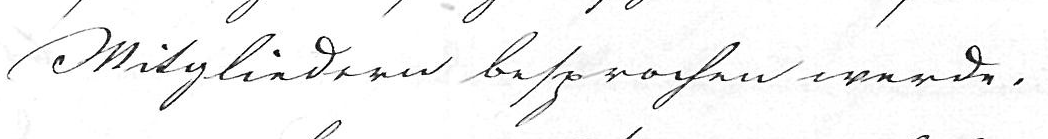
Mitgliedern besprochen werde.
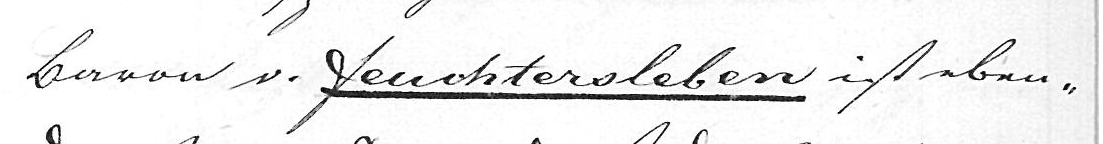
Baron v. Feuchtersleben ist eben-
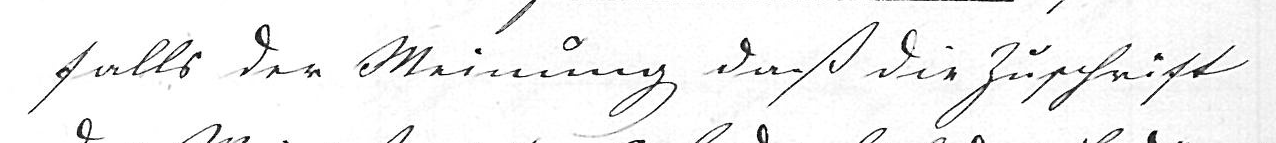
falls der Meinung daß die Zuschrift
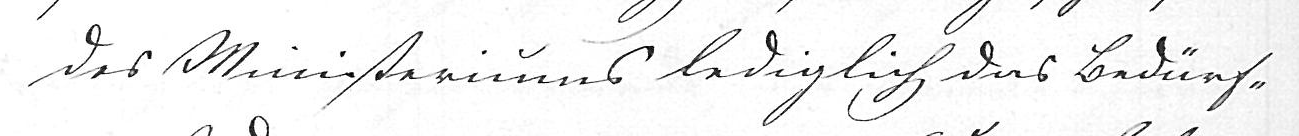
des Ministeriums lediglich das Bedürf-
